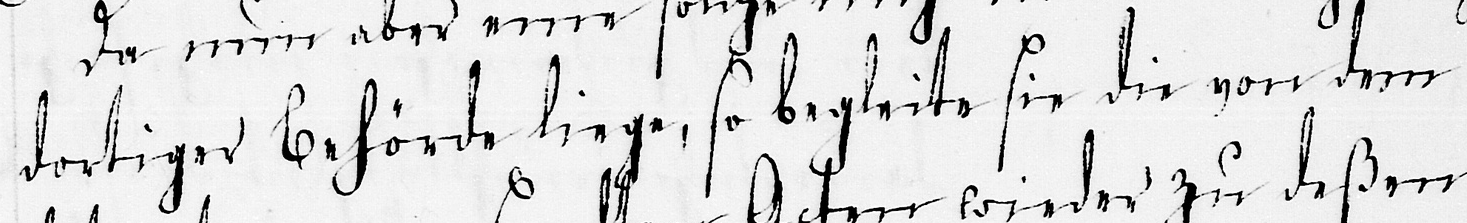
dortiger Behörde liege, so begleite sie die von dem
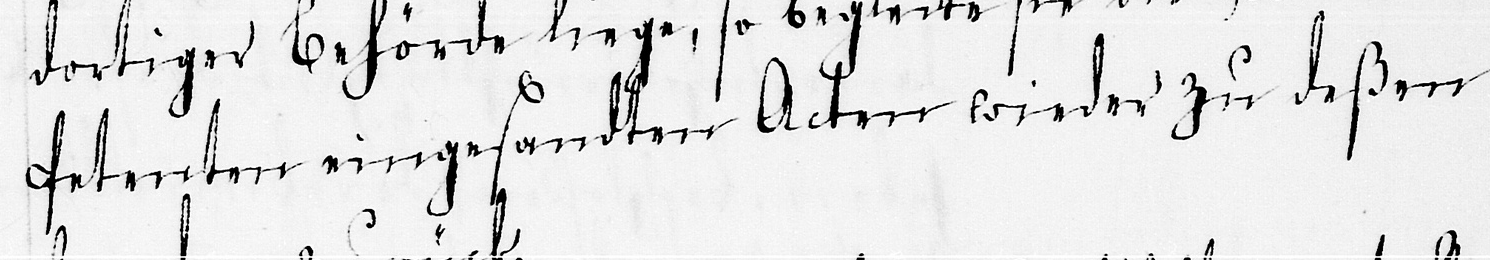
Petenten eingesandten Acten wieder zu deßen
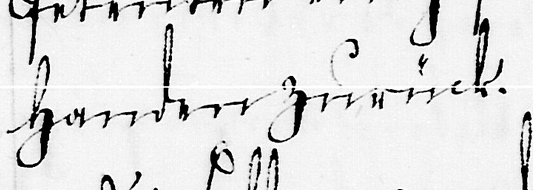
Handen zurück.
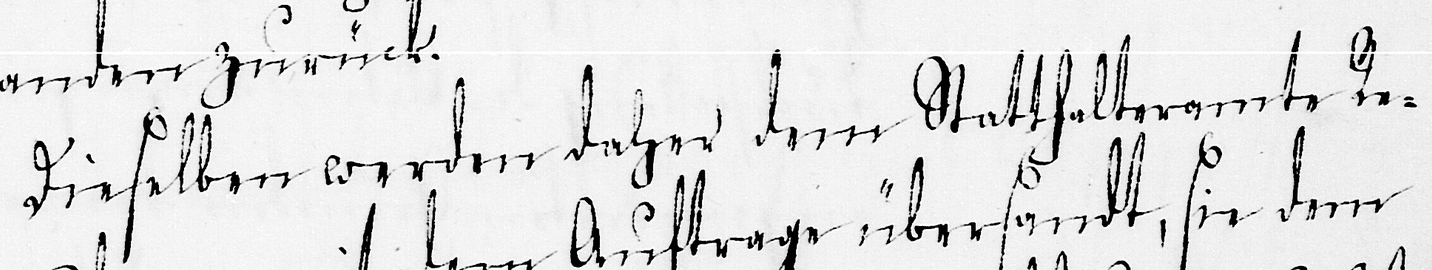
Dieselben werden daher dem Statthalteramte Re¬
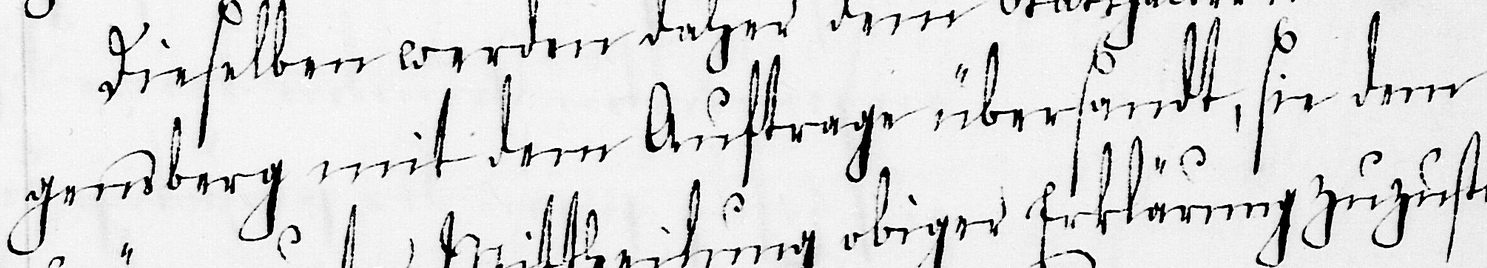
gensberg mit dem Auftrage übersandt, sie dem
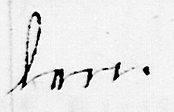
len.
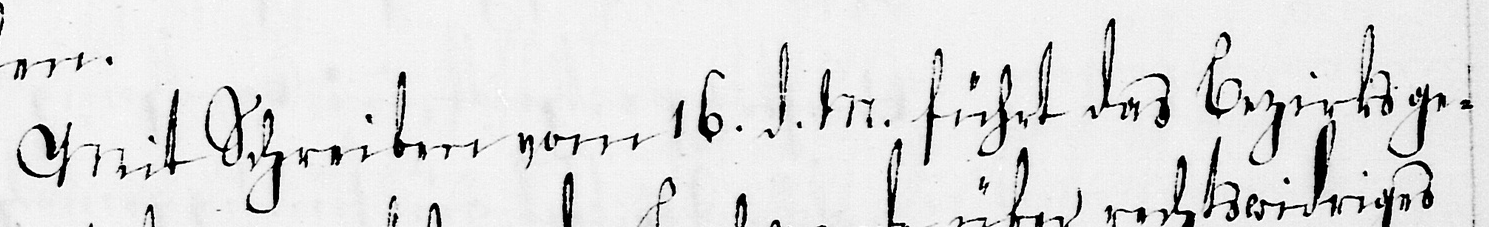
Mit Schreiben vom 16. d. M. führt das Bezirksge¬
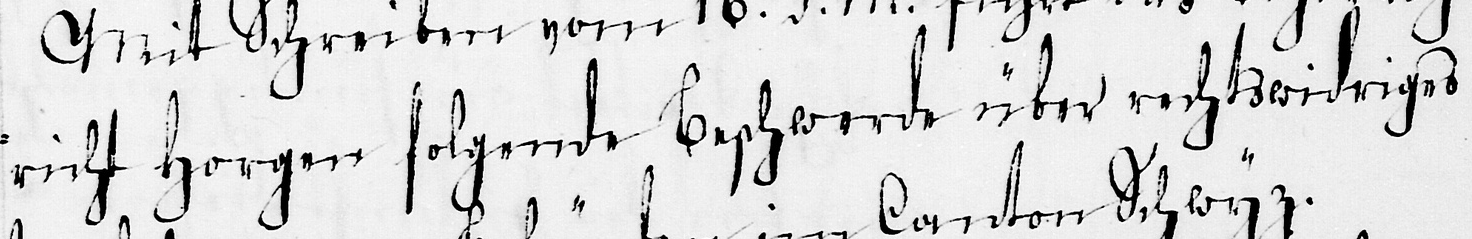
richt Horgen folgende Beschwerde über rechtswidriges
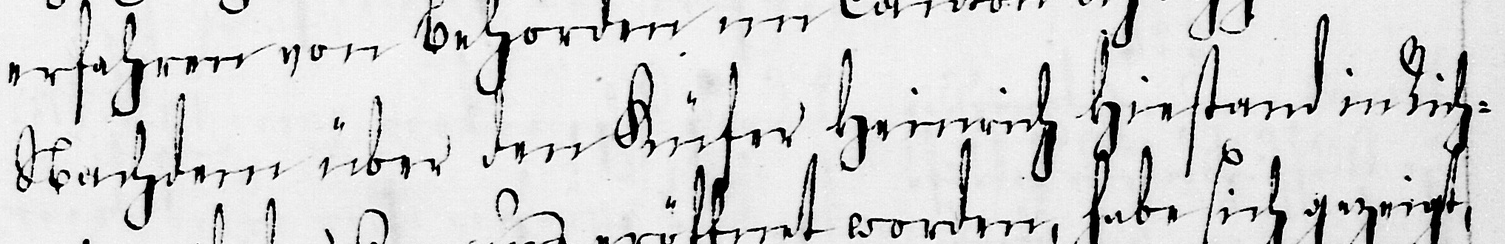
Nachdem über den Küfer Heinrich Hiestand in Rich¬
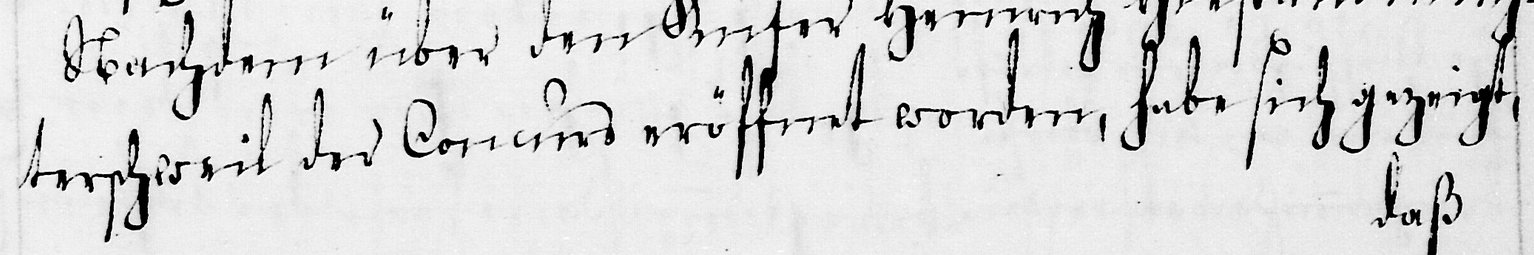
terschweil der Concurs eröffnet worden, habe sich gezeigt,
